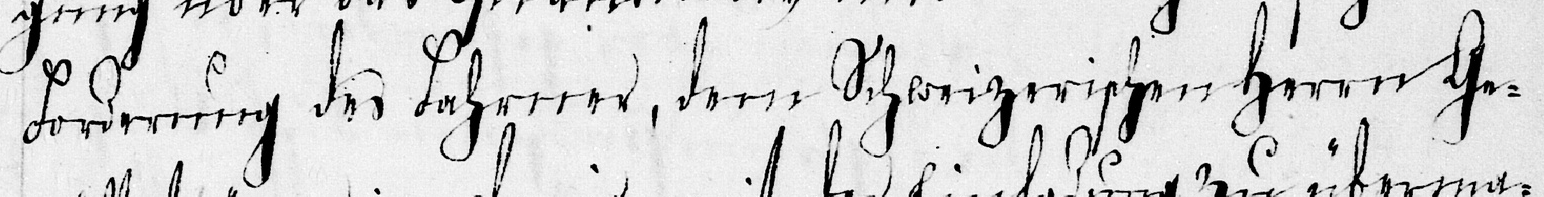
Forderung Fahrner, dem Schweizerischen Herrn Ge¬
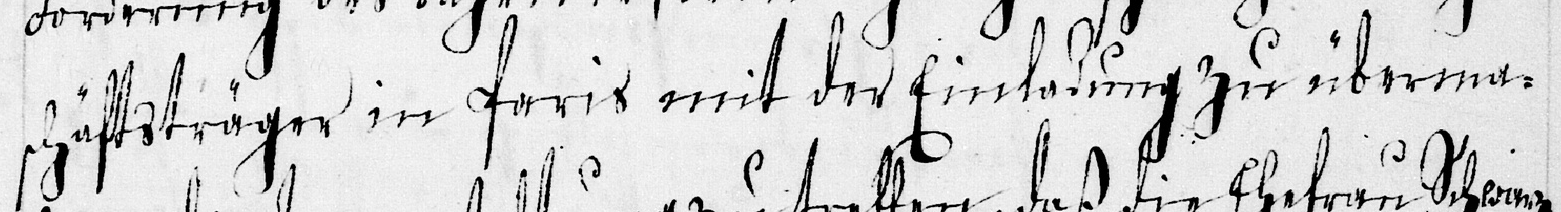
schäftsträger in Paris mit der Einladung zu überma¬
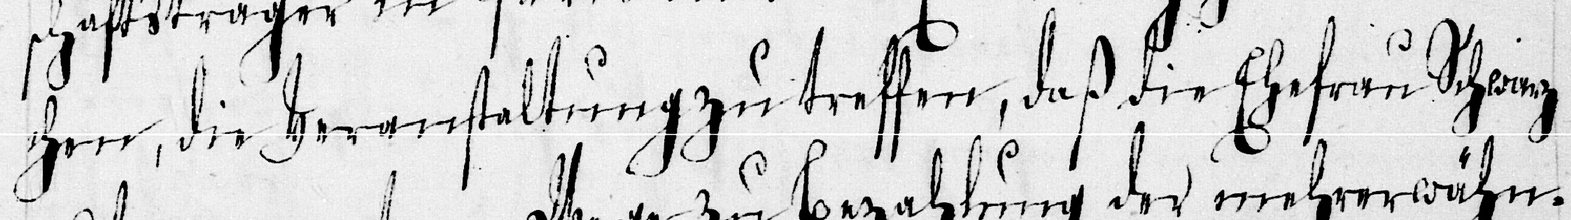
chen, die Veranstaltung zu treffen, daß die Ehefrau Schwarz
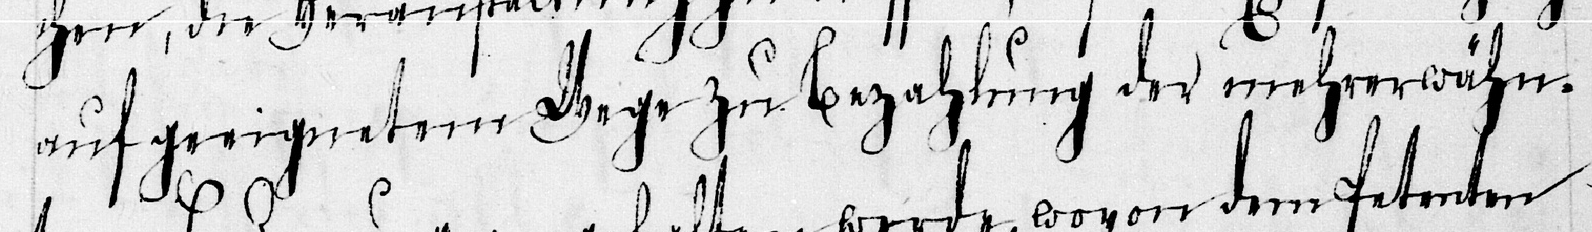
auf geeignetem Wege zu Bezahlung der mehrerwähn¬
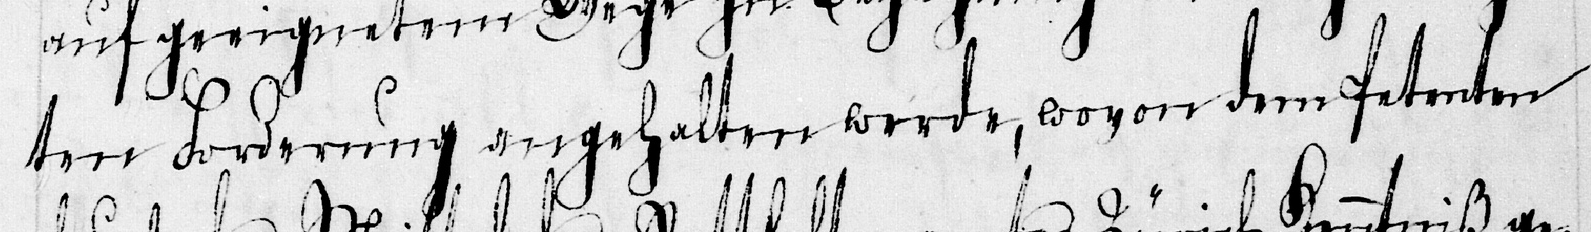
ten Forderung angehalten werde, wovon dem Petenten
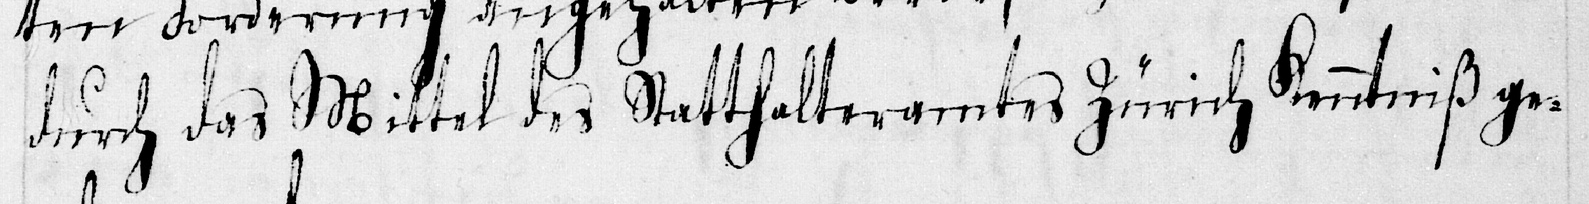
durch das Mittel des Statthalteramtes Zürich Kenntniß ge¬
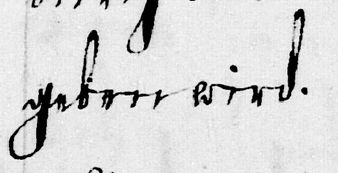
geben wird.
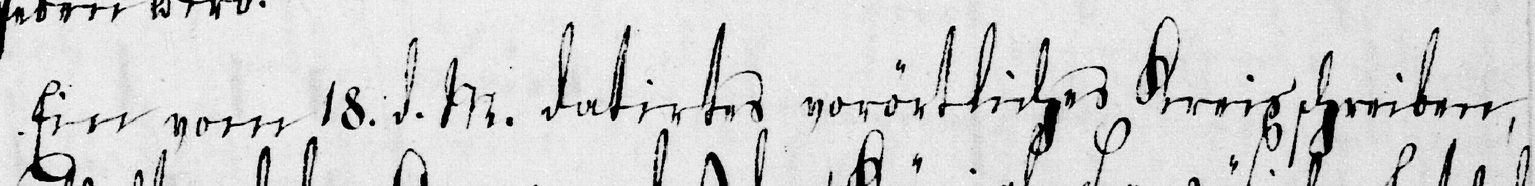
Ein vom 18. d. M. datirtes vorörtliches Kreisschreiben,
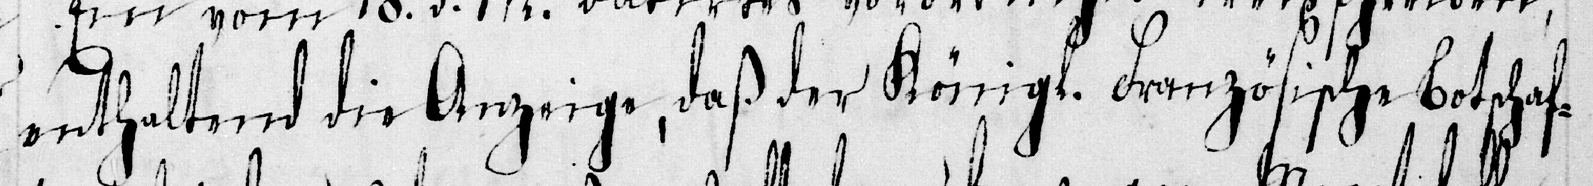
enthaltend die Anzeige, daß der Königl. Französische Botschaf¬
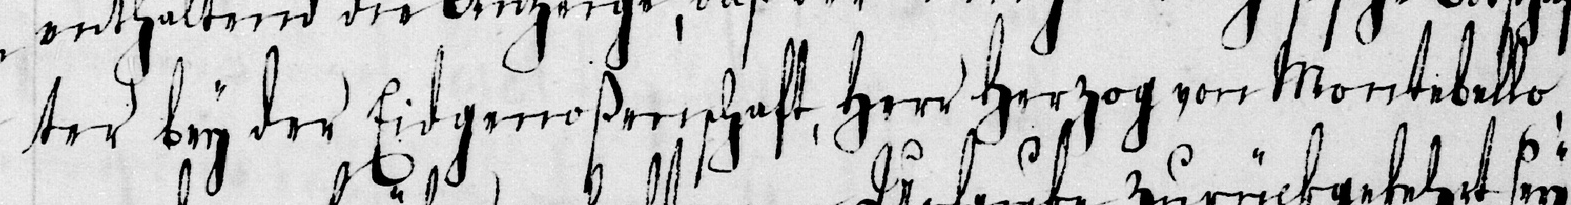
ter bey der Eidgenoßenschaft, Herr Herzog von Montebel¬
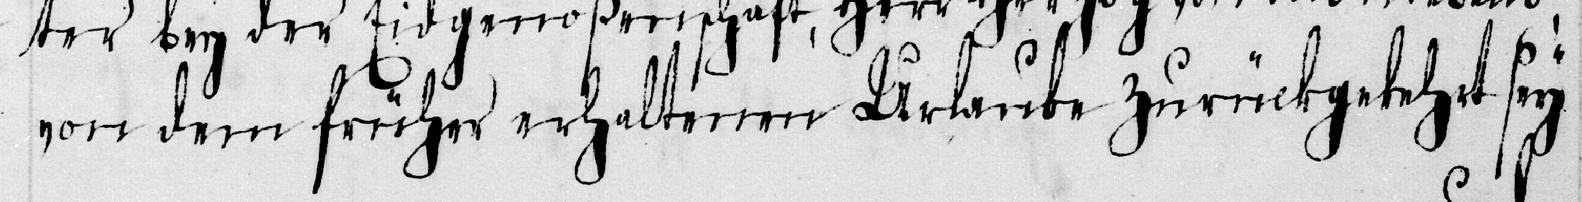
von dem früher erhaltenen Urlaube zurückgekehrt sey
